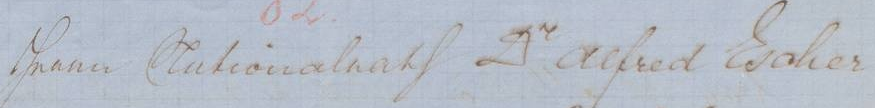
Herrn Nationalrath Dr Alfred Escher
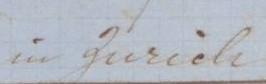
in Zurich
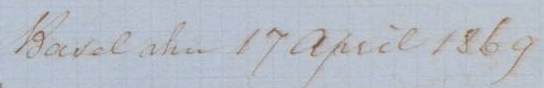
Basel den 17 April 1869
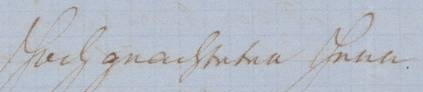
Hochgeachteter Herr,
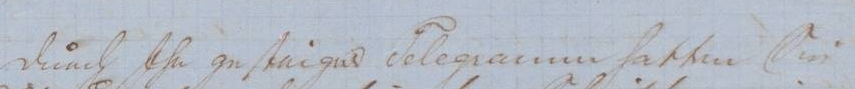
Durch Ihr gestriges Telegramm hatten Sie
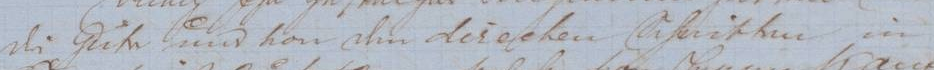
die Güte uns von den directen Schritten in
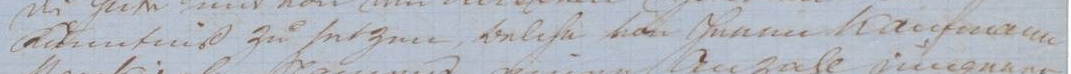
Kenntniß zu setzen, welche von Ihnen Kaufmann
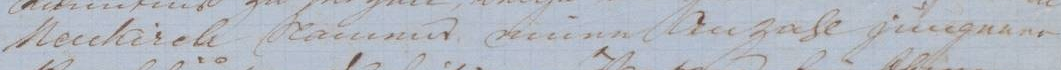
Neukirch Namens einer Anzahl jüngerer
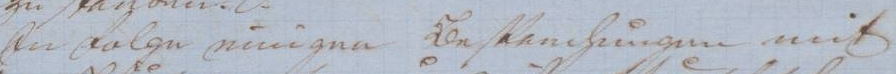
In Folge einiger Besprechungen mit
